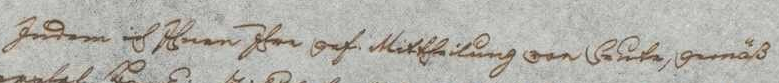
Indem ich Ihnen Ihre gef. Mittheilung von heute, gemäß
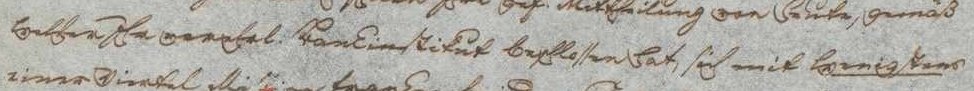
welcher Ihr verehrl. Bankinstitut beschlossen hat, sich mit wenigstens
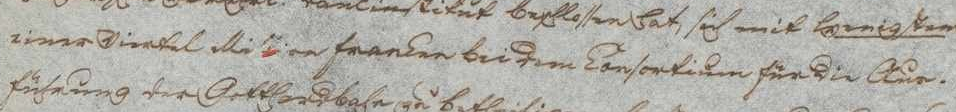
einer Viertel Million Franken bei dem Consortium für die Aus-
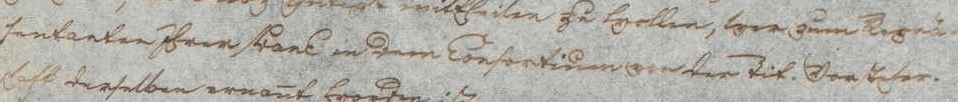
sentanten Ihrer Bank in dem Consortium von der Tit. Vorsteher-
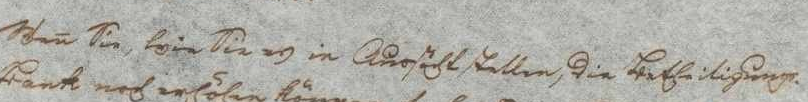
Wenn Sie, wie Sie es in Aussicht stellen, die Beteiligungs-
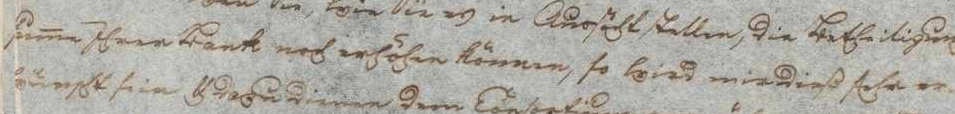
summe Ihrer Bank noch erhöhen können, so wird mir dieß sehr er-
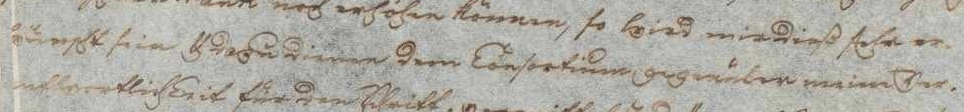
wünscht sein & dazu dienen, dem Consortium gegenüber meine Ver-
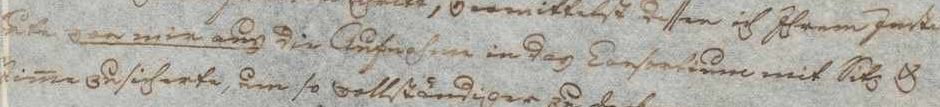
tute von mir aus die Aufnahme in das Consortium mit Sitz &
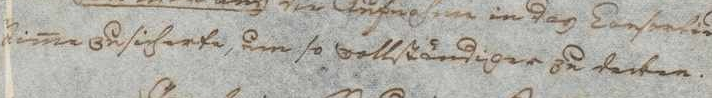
Stimme zusicherte, um so vollständiger zu decken.
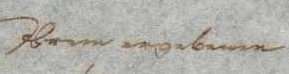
Ihrem ergebenen
